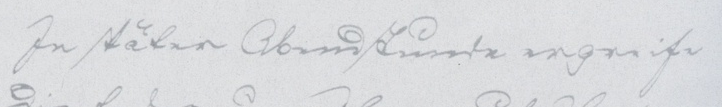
In später Abendstunde ergreife
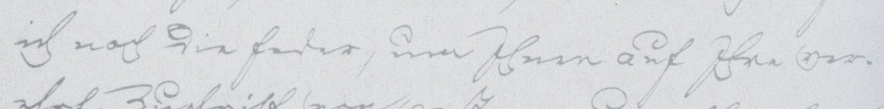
ich noch die Feder, um Ihnen auf Ihre ver-
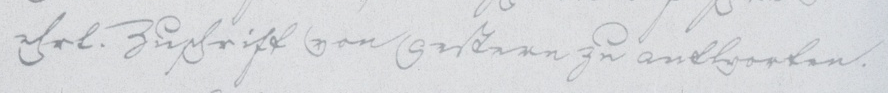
ehrl. Zuschrift von gestern zu antworten.
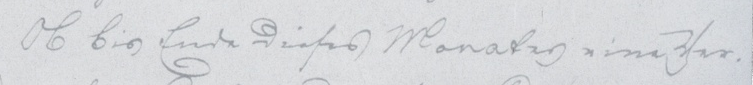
Ob bis Ende dieses Monates eine Ver-
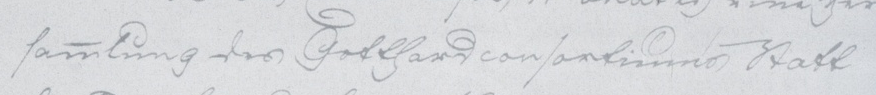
sammlung des Gotthardconsortium's Statt
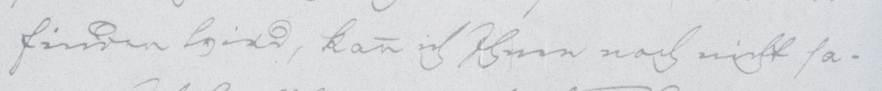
finden wird, kann ich Ihnen noch nicht sa-
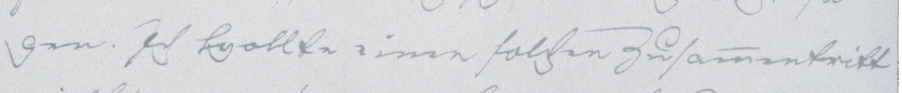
gen. Ich wollte einen solchen Zusammentritt
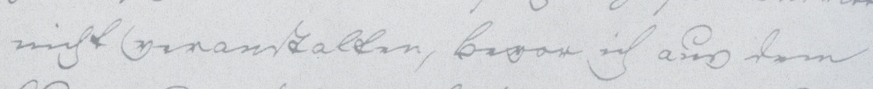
nicht veranstalten, bevor ich aus dem
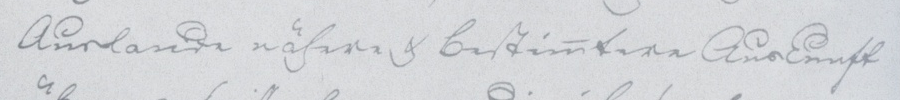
Auslande nähere & bestimmtere Auskunft
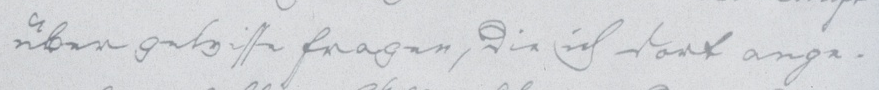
über gewisse Fragen, die ich dort ange-
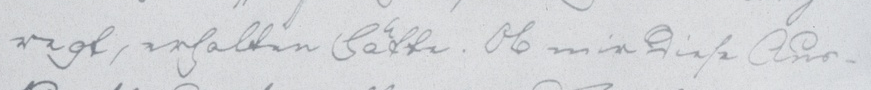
regt, erhalten hätte. Ob mir diese Aus-
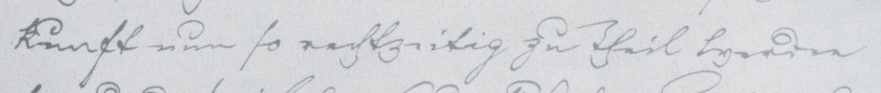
kunft nun so rechtzeitig zu Theil werden
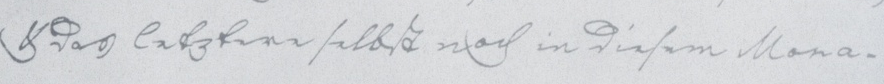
& das letztere selbst noch in diesem Mona-
